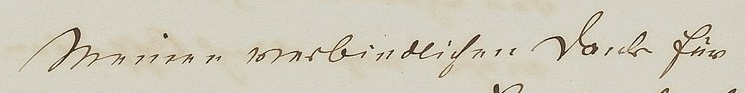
Meinen verbindlichen Dank für
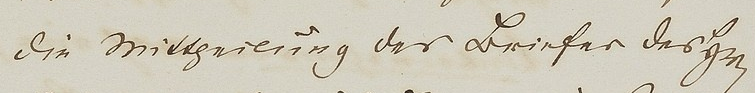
die Mittheilung des Briefes des Hrn.
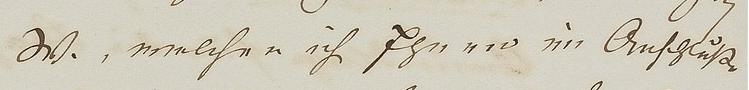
W., welchen ich Ihnen im Anschluße
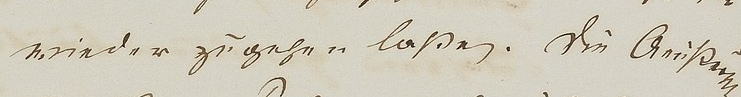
wieder zugehen laße. Die Aeußerungen
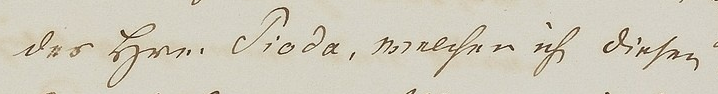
des Hrn. Pioda, welchen ich diesen
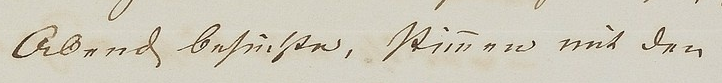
Abend besuchte, stimmen mit den
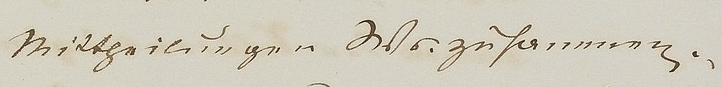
Mittheilungen Ws. zusammen. –
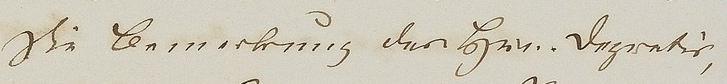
Die Bemerkung des Hrn. Depretis,
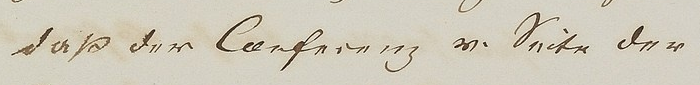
daß der Conferenz v. Seite der
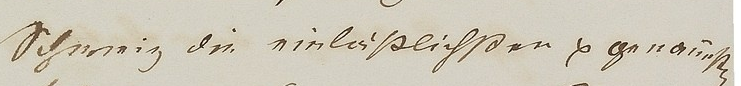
Schweiz die einläßlichsten & genauesten
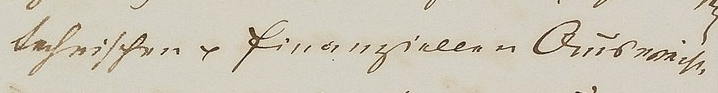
technischen & finanziellen Ausweise
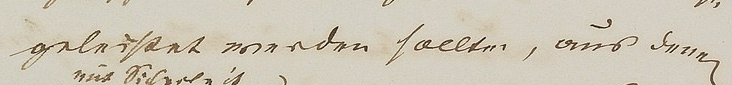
geleistet werden sollten, aus denen
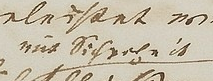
mit Sicherheit
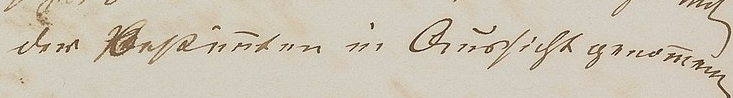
der bestimmten in Aussicht genommenen
